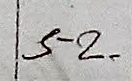52
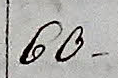60
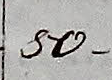50
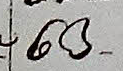63
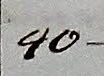40
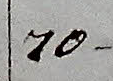70
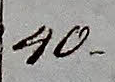40
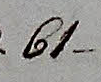61
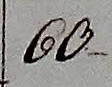60
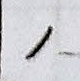1
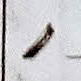1
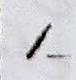1
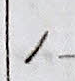1
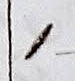1
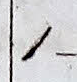1
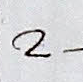2
